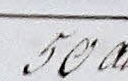50
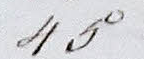45
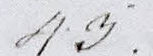43
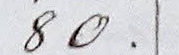80.
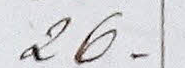26.
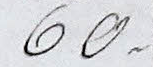60
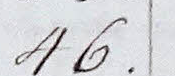46.
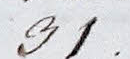31
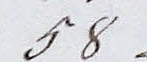58
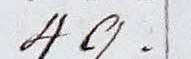49.
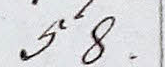58.
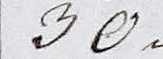30
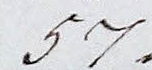57
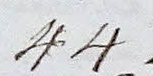44
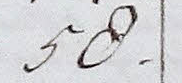58.
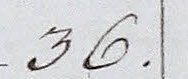36.
